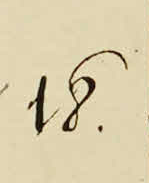18.
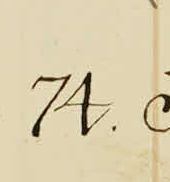74.
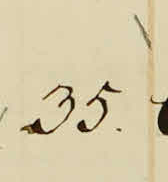35.
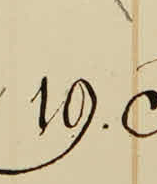19.
